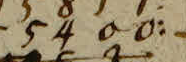5400
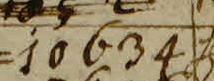10634
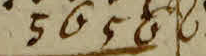5656
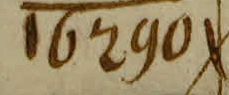16290
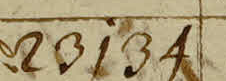23134
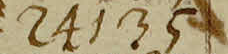24135
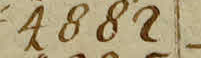4882
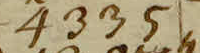4335
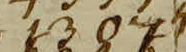1307
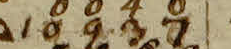10937
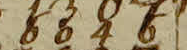6046
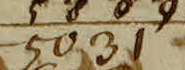5031
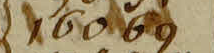16069
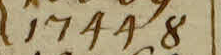17448
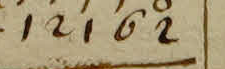12162
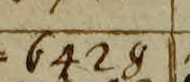6428
